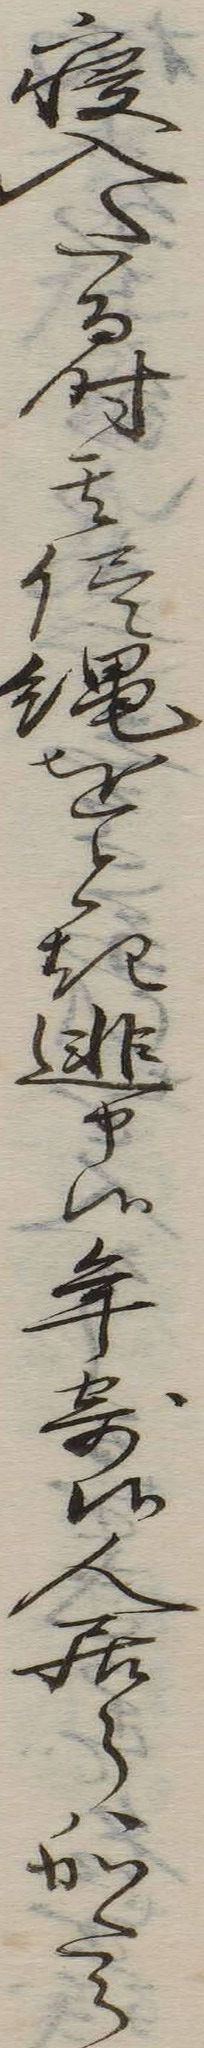寝入たる時其侭縄をとき逃申候年寄候人居らはかたら
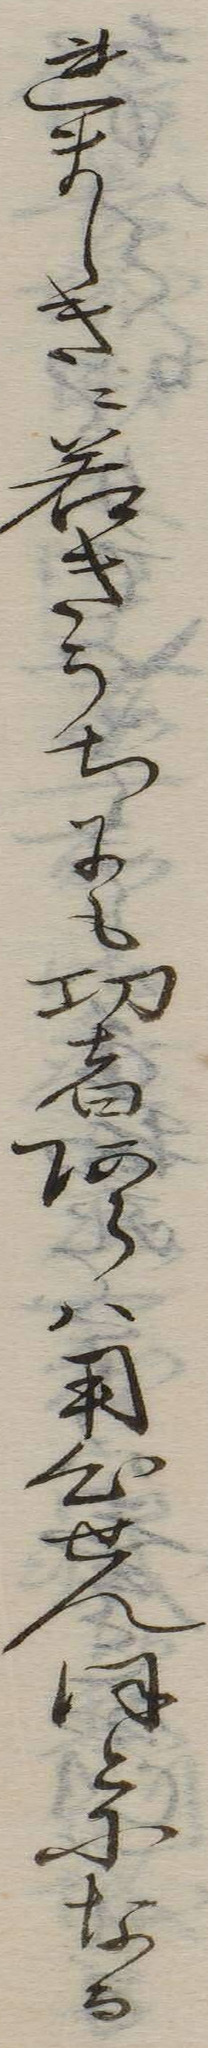れましきニ若きうちにも功者あらは用心せんほとになる
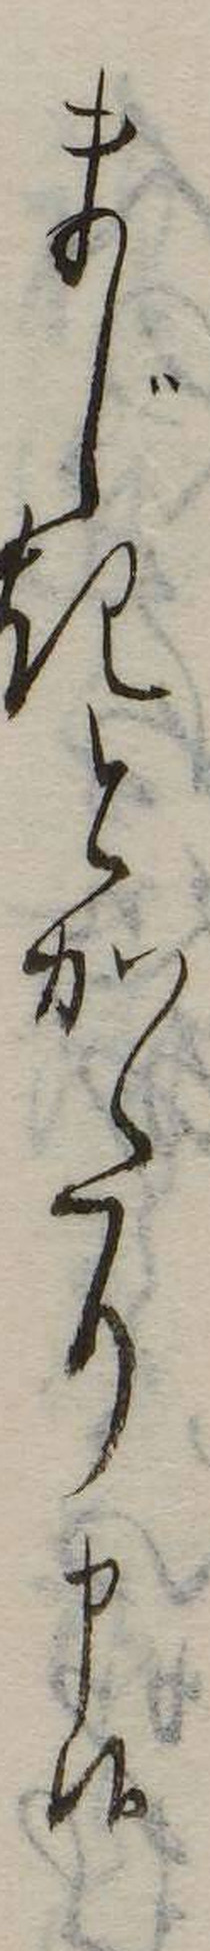まじきとかたり申候
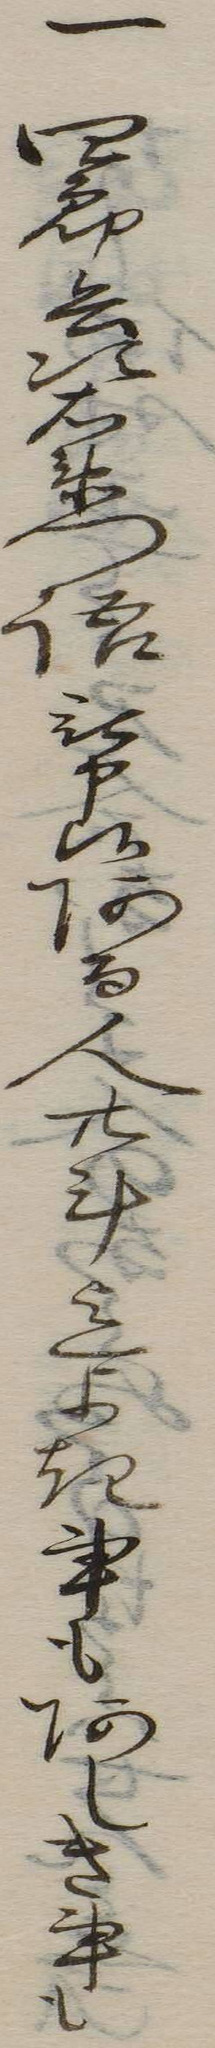一四郎兵次右衛門語被申候ある人廿斗迄よき事もあしき事も
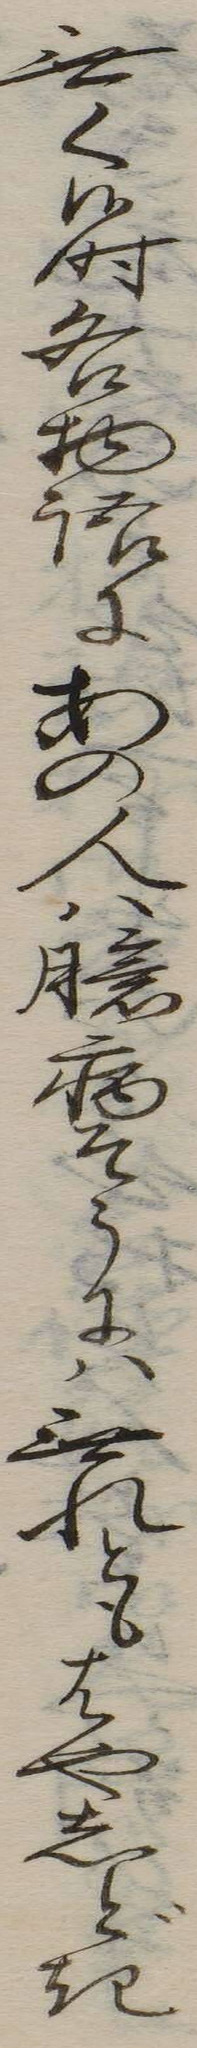無く候時各物語にあの人は臆病そうには無れともはやしどき
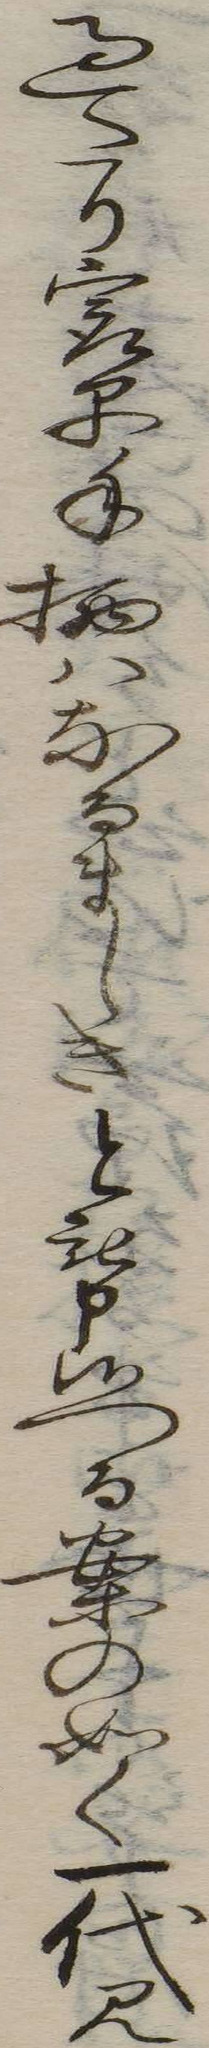過たり㝡早手柄はなるましきと被申候つる案の如く一代見
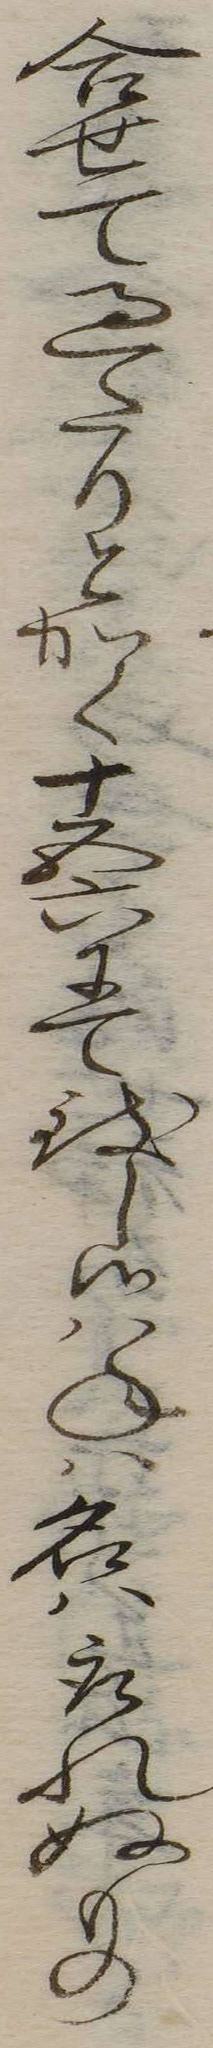合せて過たりとかく十五六にて致し候はねは名は取れぬもの

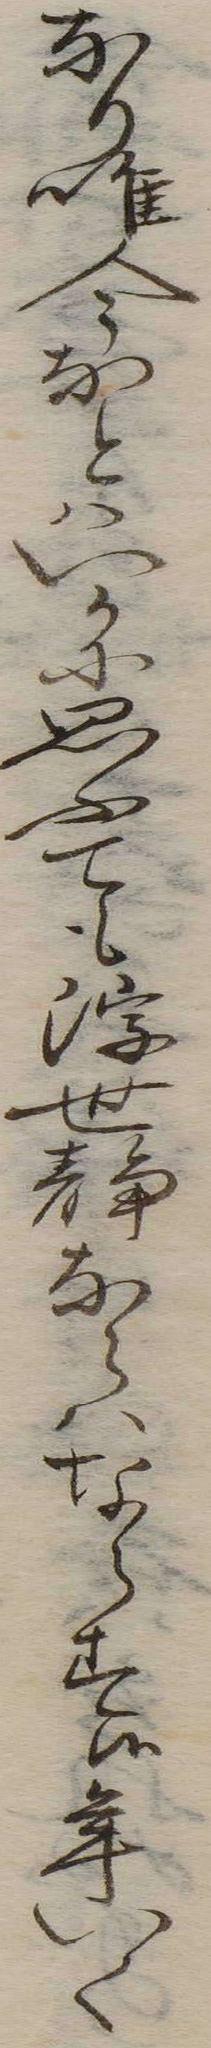なり唯今なとはいかに思ふても浮世静ならはならす候年いく
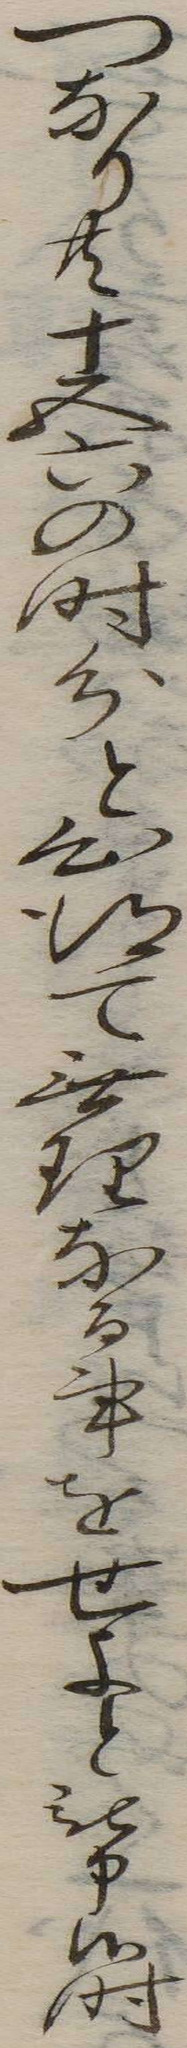つなり共十五六の時分と心得て無理なる事をせよと被申候時
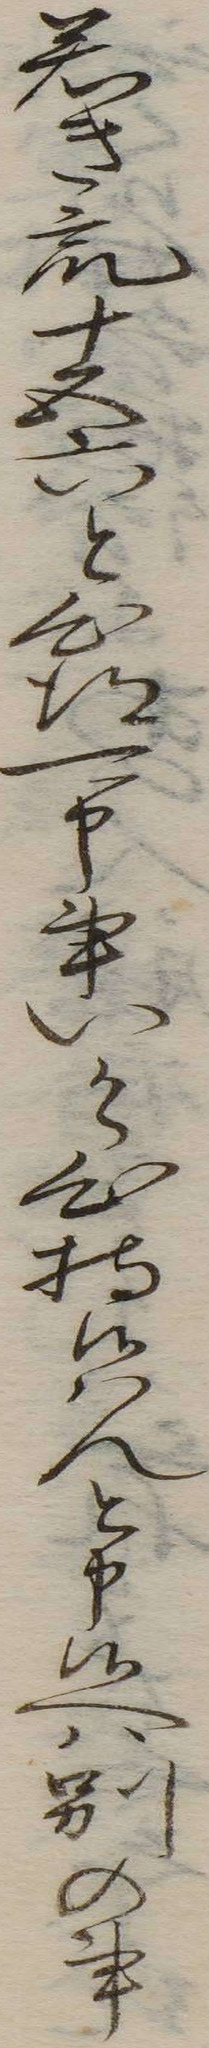若き衆十五六と心得可申事いかゝ心持候はんと申候へは別の事
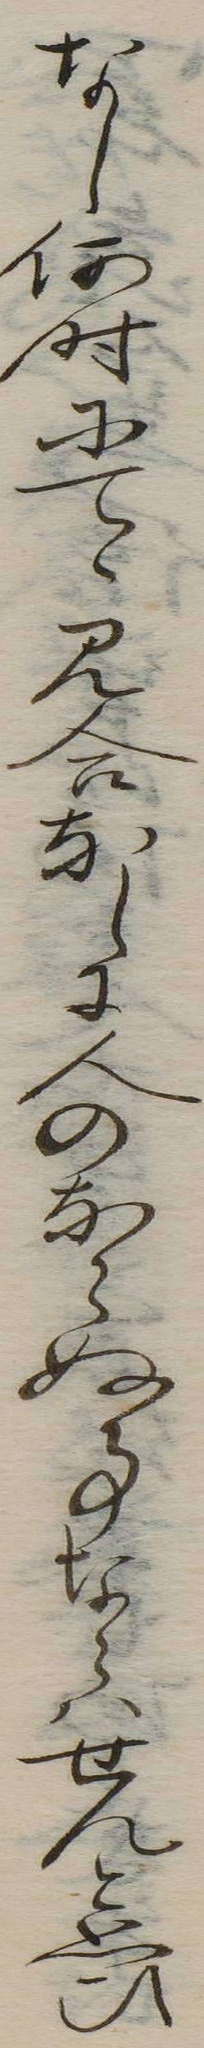なし何時にても見合なしに人のならぬ事ならはせんと思ひ
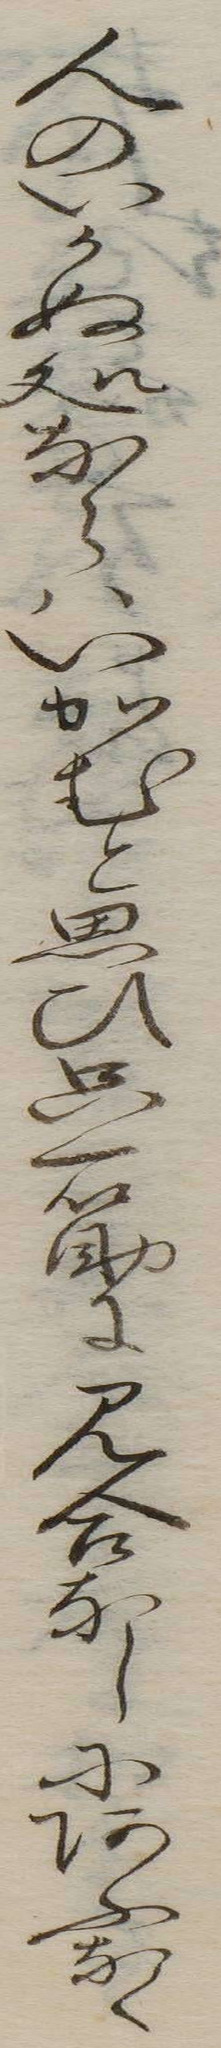人のいかぬ処ならはいかむと思ひ只一筋に見合なしにあふなく
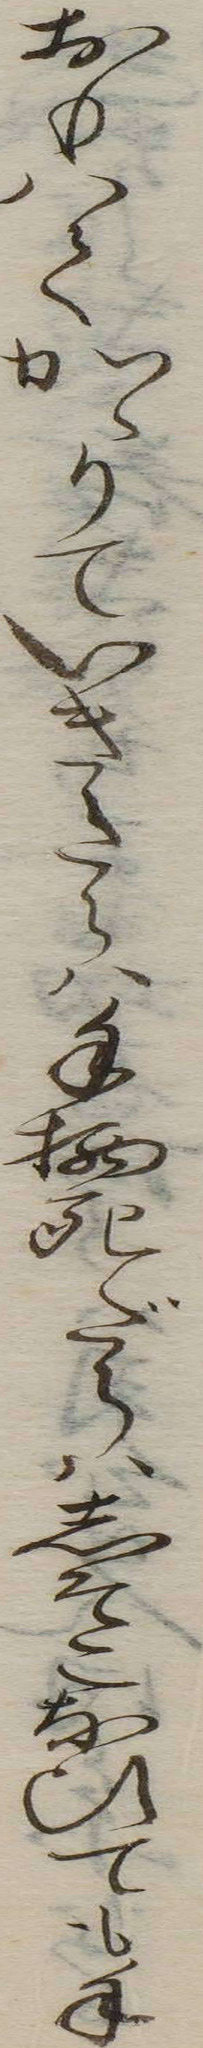おもはてかゝりていきたらは手柄死ざらはしそこなひても手
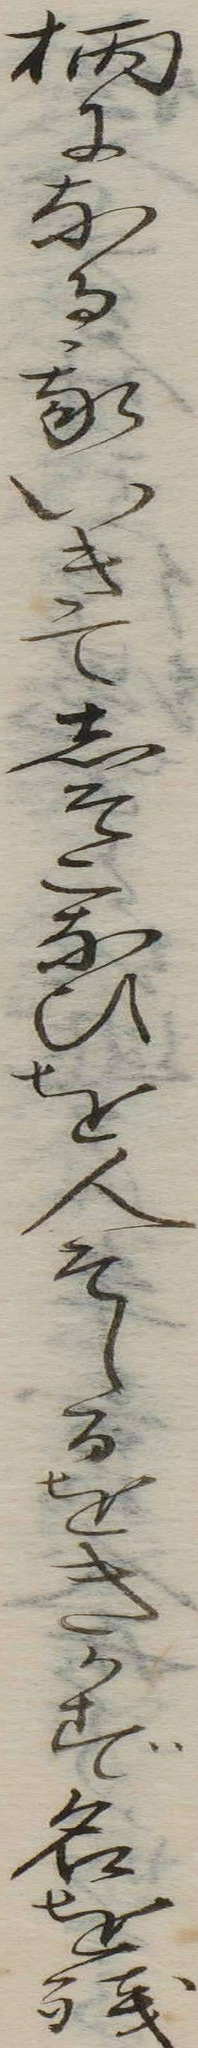柄になる我いきてしそこなひを人そしるをきかず名を残
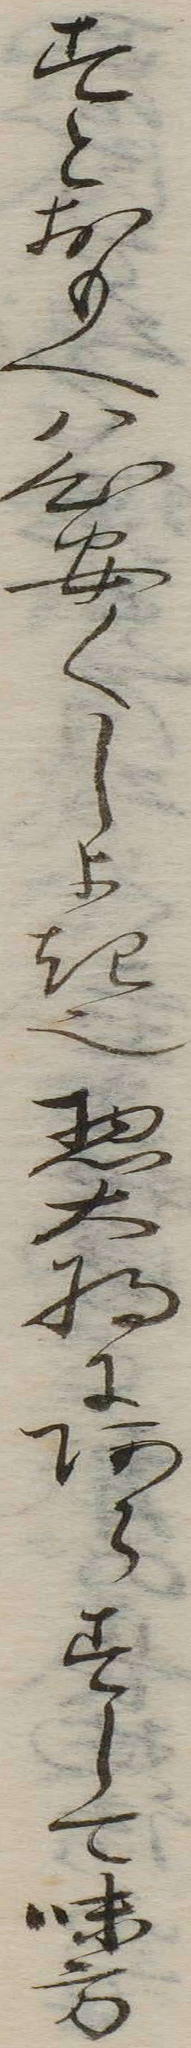すとおもへは心安くしよき也惣大将にあらすして味方
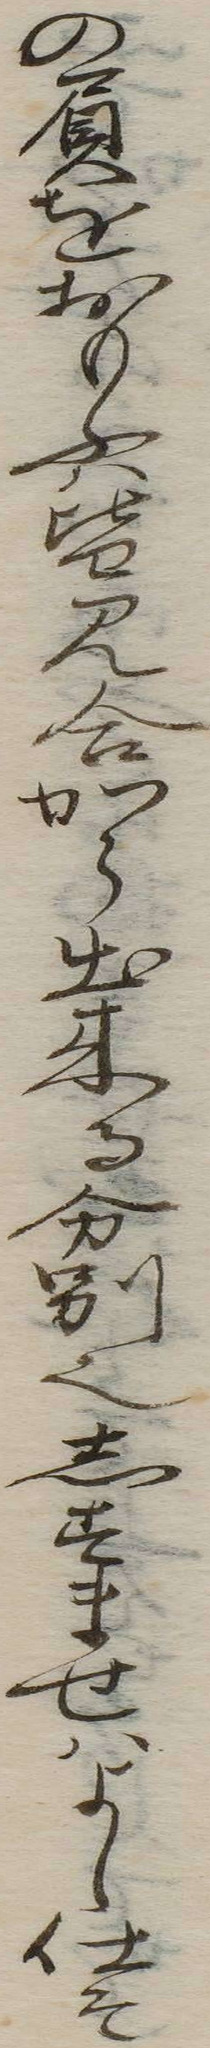の負をおもふは皆見合から出来る分別也しすませはよし仕そ
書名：三河之物語
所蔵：国文学研究資料館
